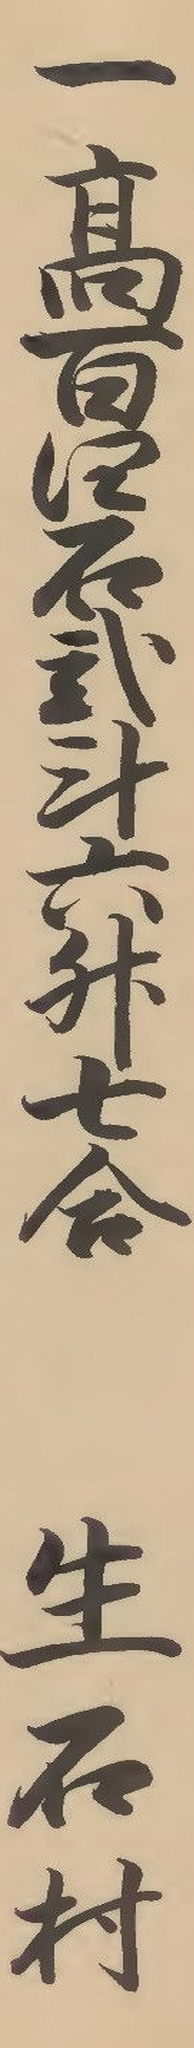一髙百四石弐斗六升七合生石村
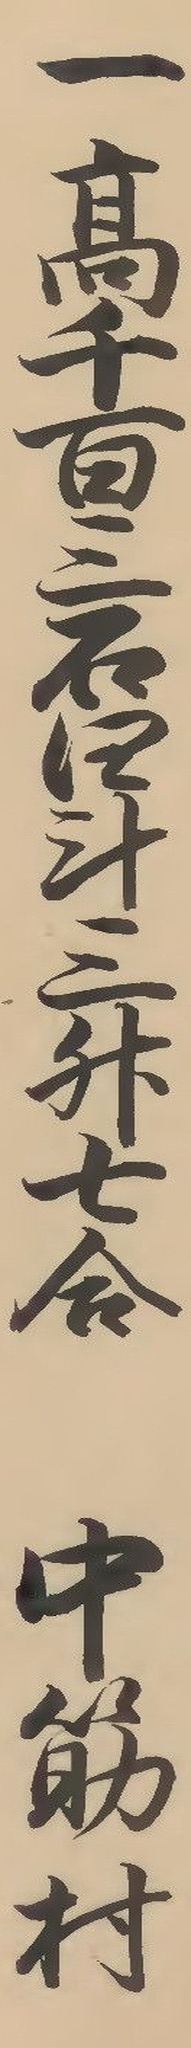一髙千百三石四斗三升七合中筋村
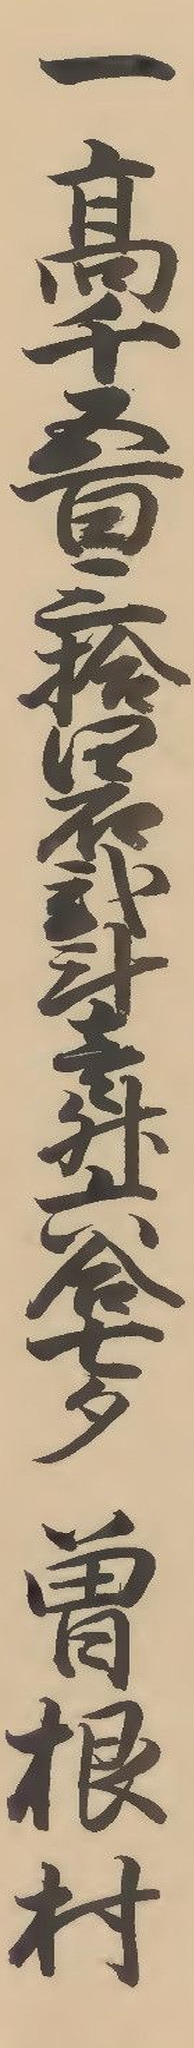一髙千五百三拾四石弐斗壱升六合七夕曽根村

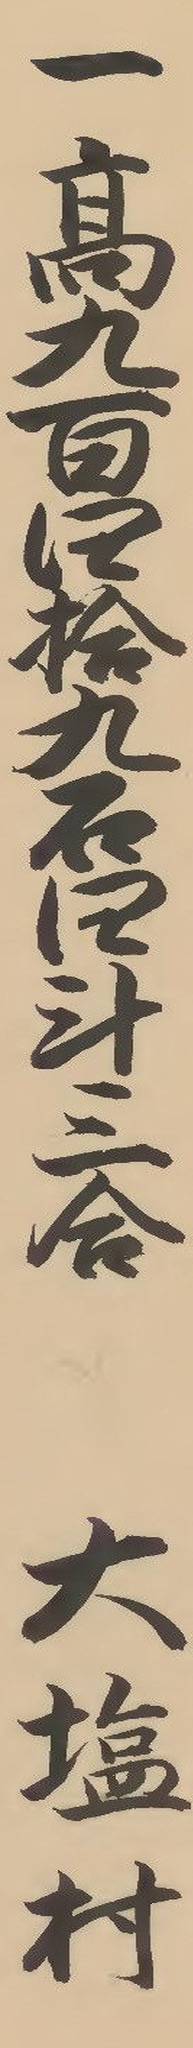一髙九百四拾九石四斗三合大塩村
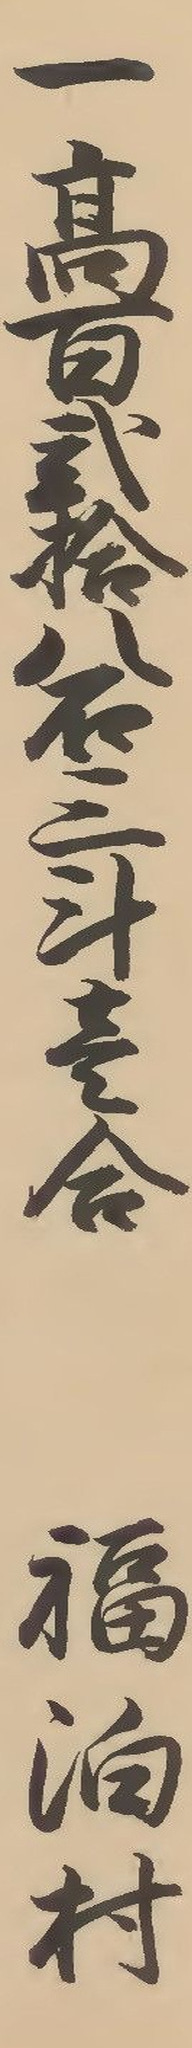一髙百弐拾八石三斗壱合福泊村
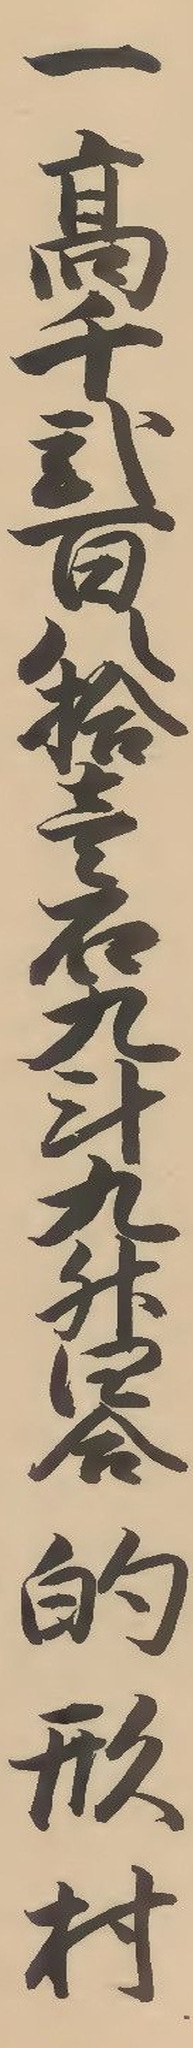一髙千弐百八拾壱石九斗九升四合的形村
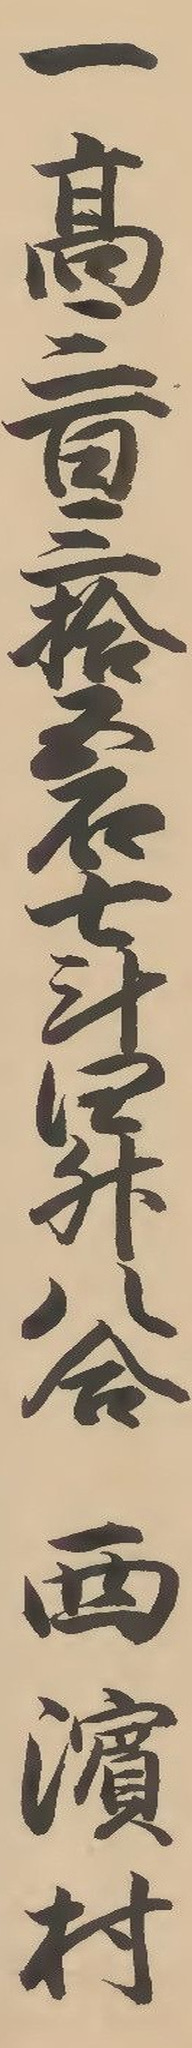一髙三百三拾五石七斗四升八合西濱村
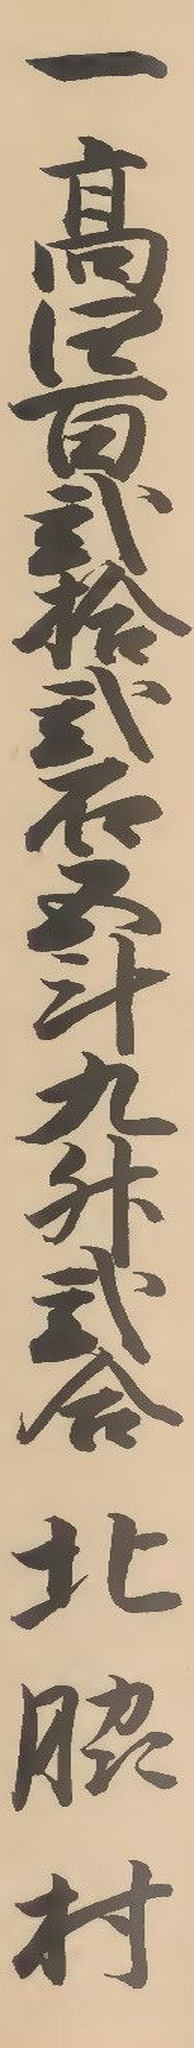一髙四百弐拾弐石五斗九升弐合北脇村
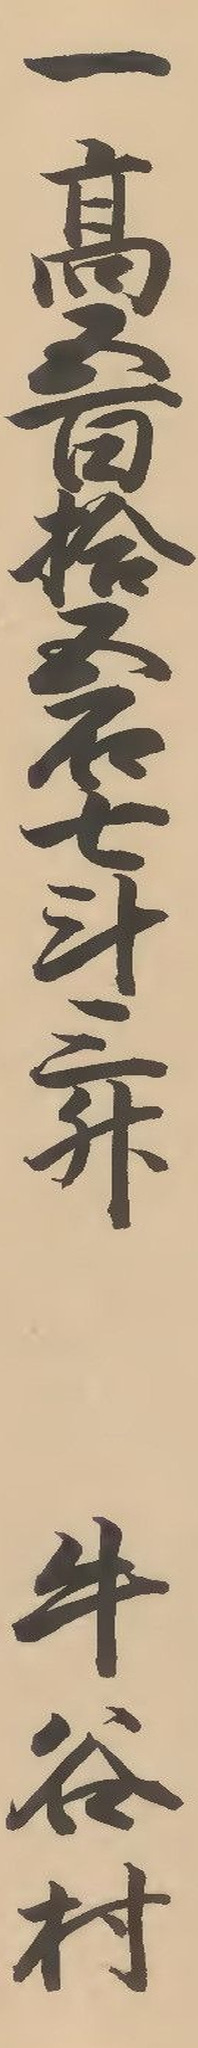一髙五百拾五石七斗三升牛谷村
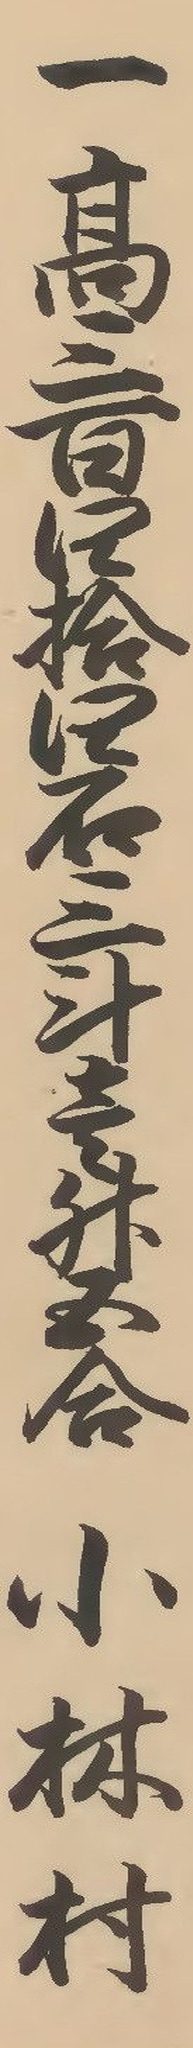一髙三百四拾四石三斗壱升五合小林村
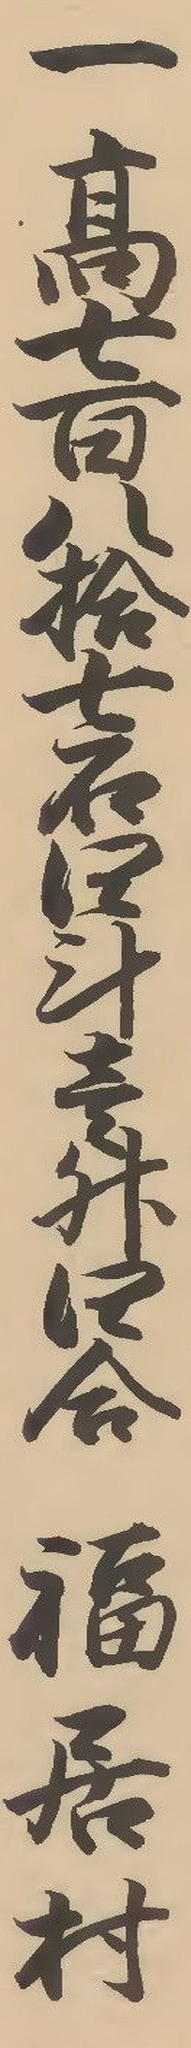一髙七百八拾七石四斗壱升四合福居村

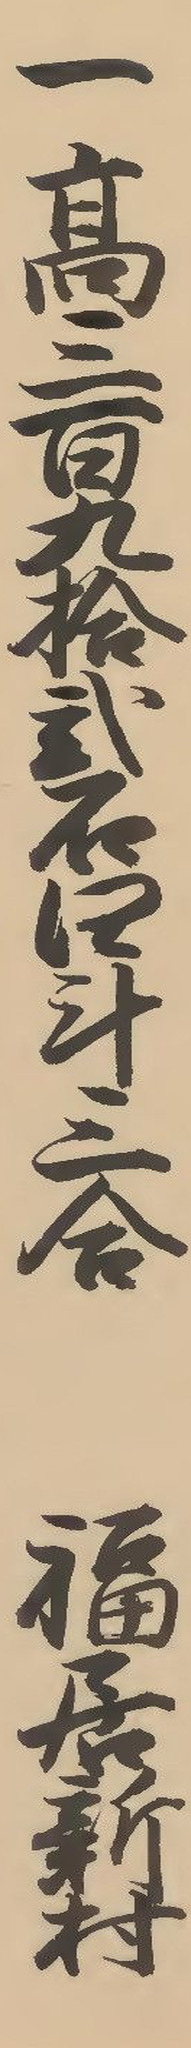一髙三百九拾弐石四斗三合福居新村
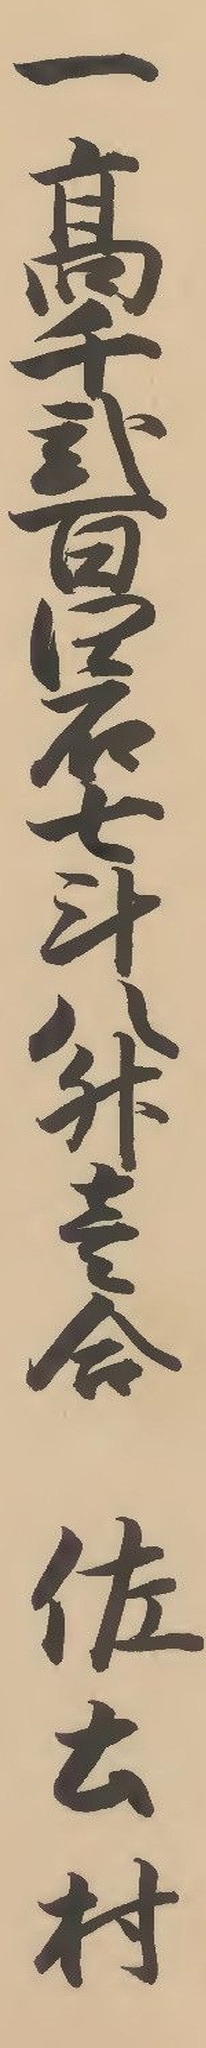一髙千弐百四石七斗八升壱合佐土村
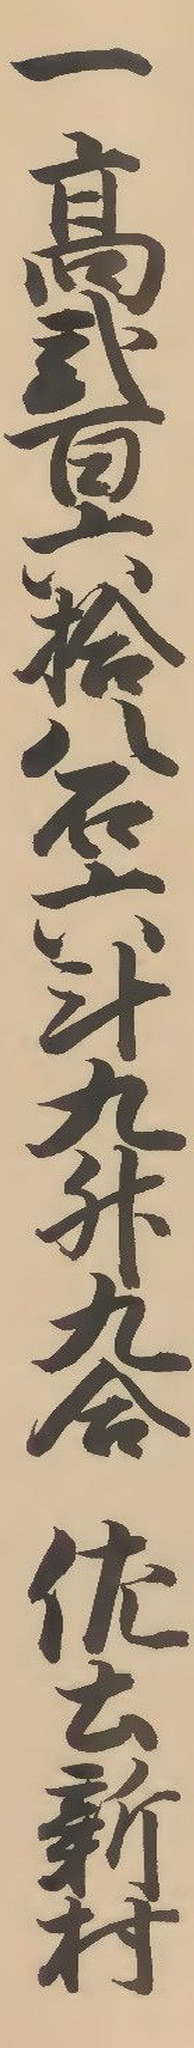一髙弐百六拾八石六斗九升九合佐土新村
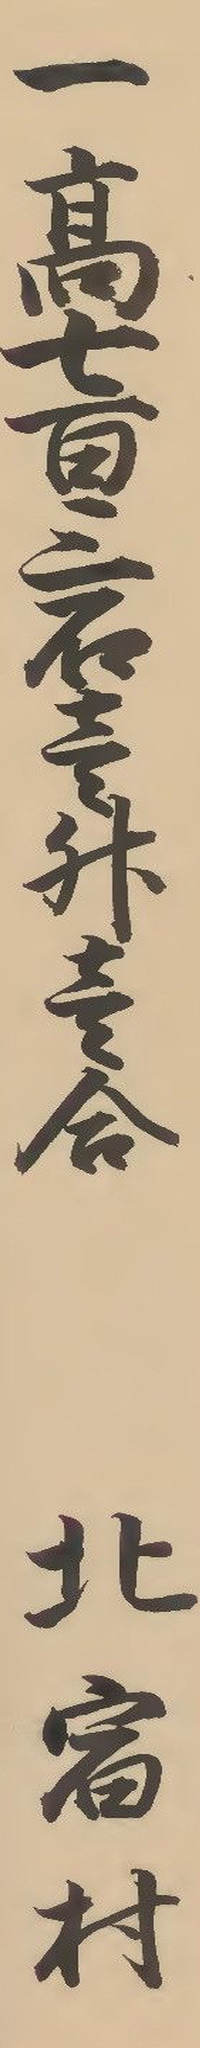一髙七百三石壱升壱合北宿村
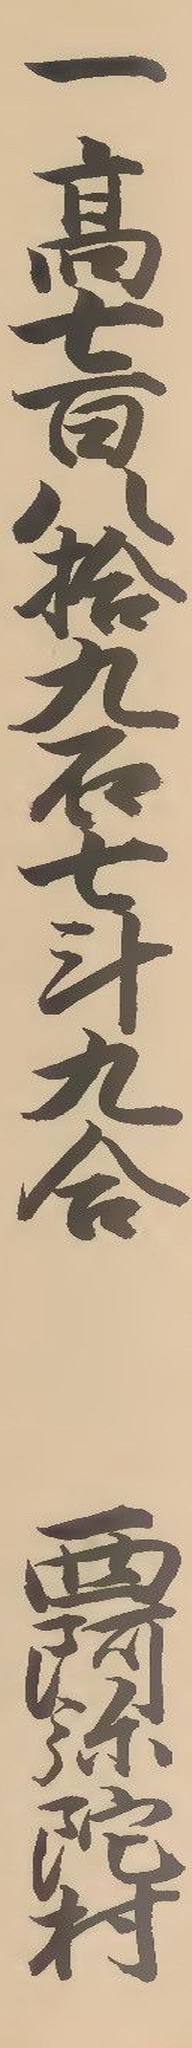一髙七百八拾九石七斗九合西阿弥陀村
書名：播磨国郷帳
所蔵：国立公文書館 National Archives of Japan
